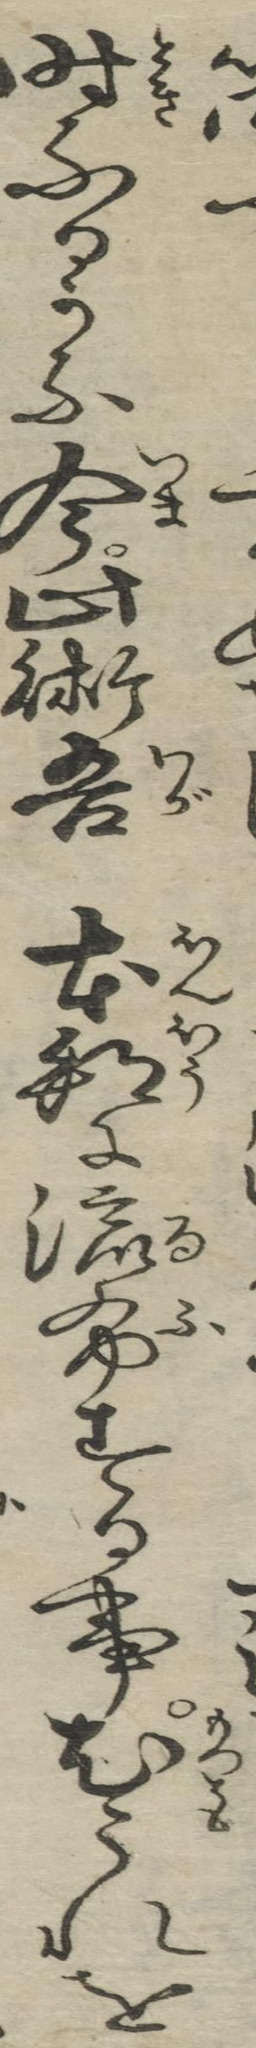時ふるかふ今。此術吾本邦に流布する事。尤これを
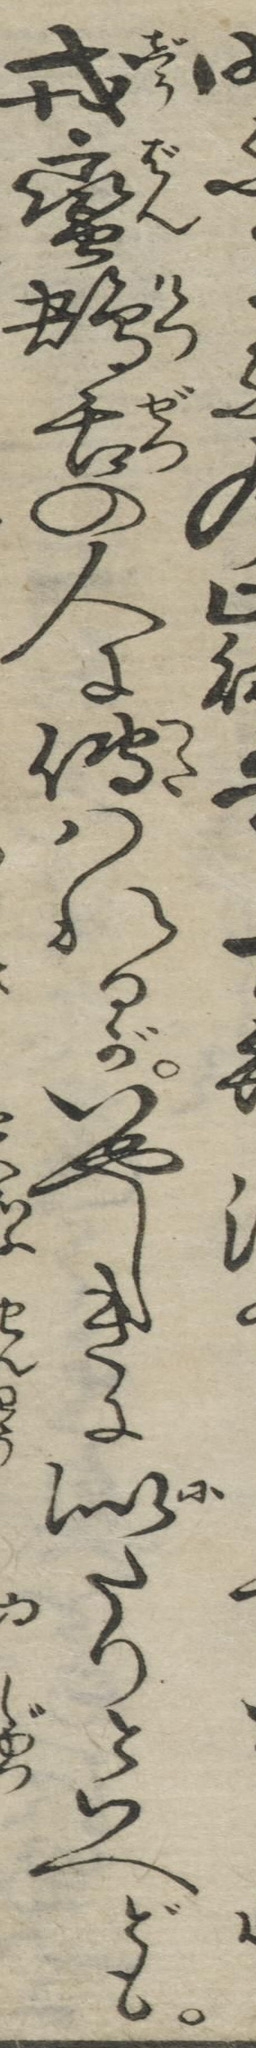戎蛮鴂舌の人に伝はれるが。いやしきに似たりといへども。
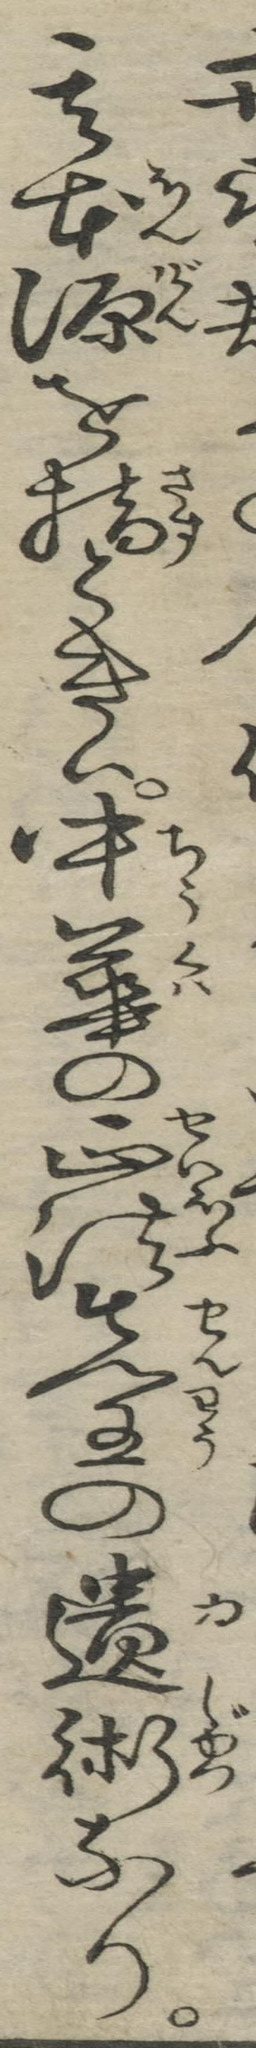其本源を指ときは。中華の正法先王の遺術なり。

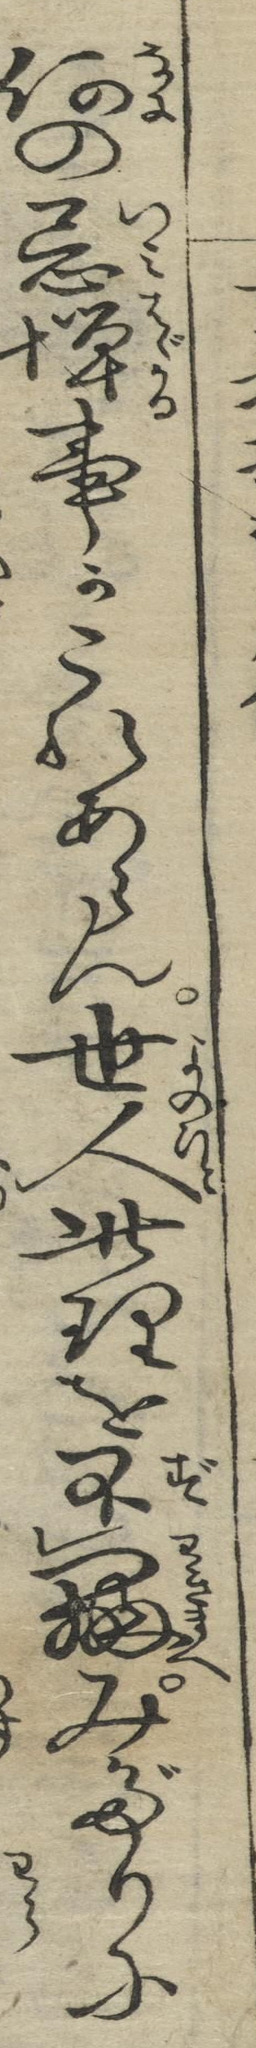何の忌憚事かこれあらん。世人此理を不辨。みだりに
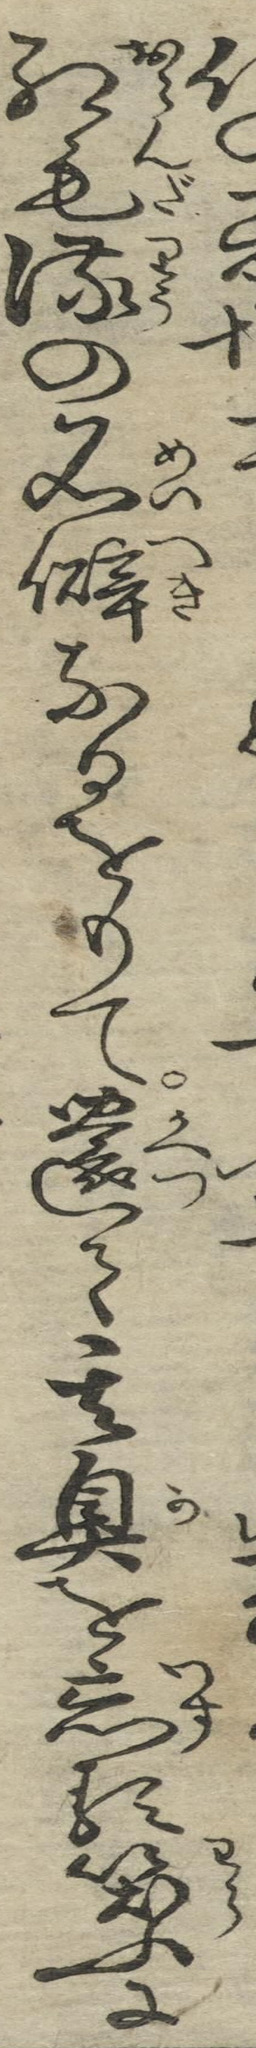紅毛流の名僻なるをもて。還て其臭を忘る笑ふに
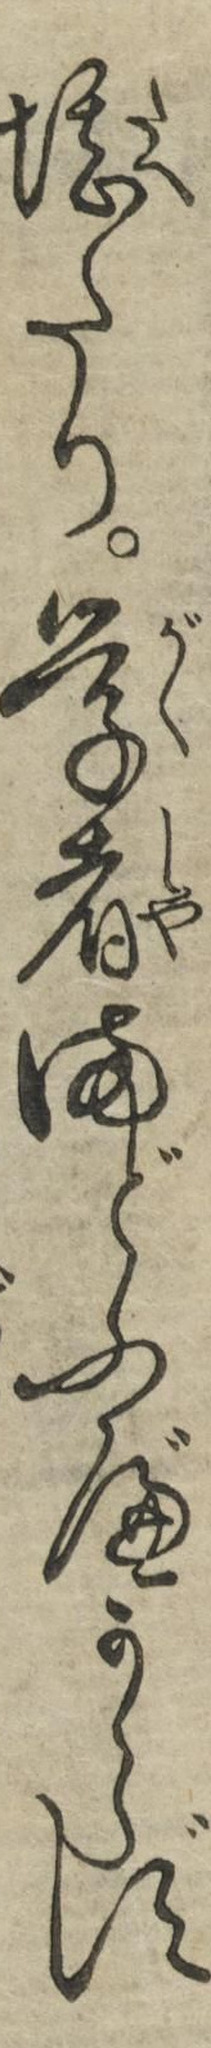堪たり。学者まどふべからず
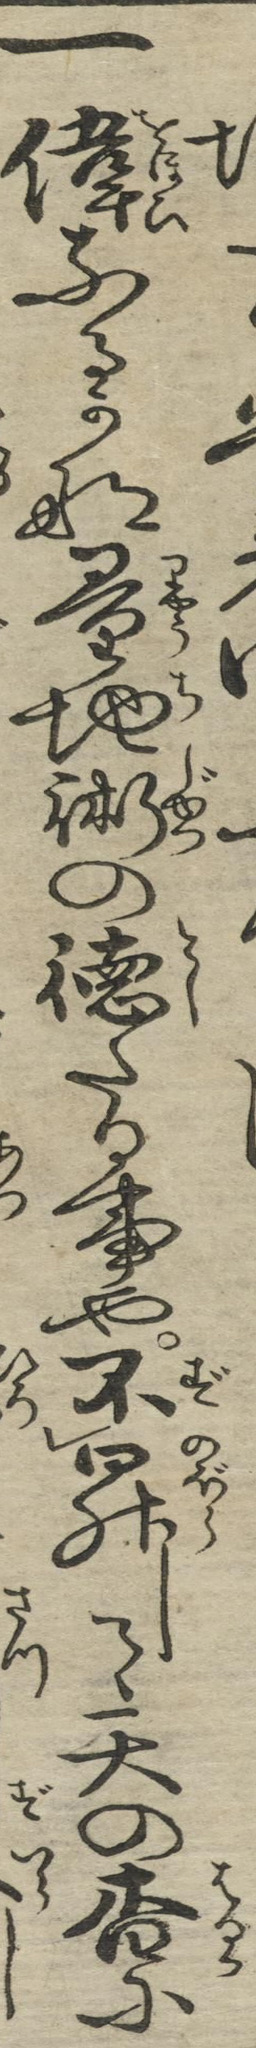一偉なるかな量地術の徳たる事や。不昇して天の杳に
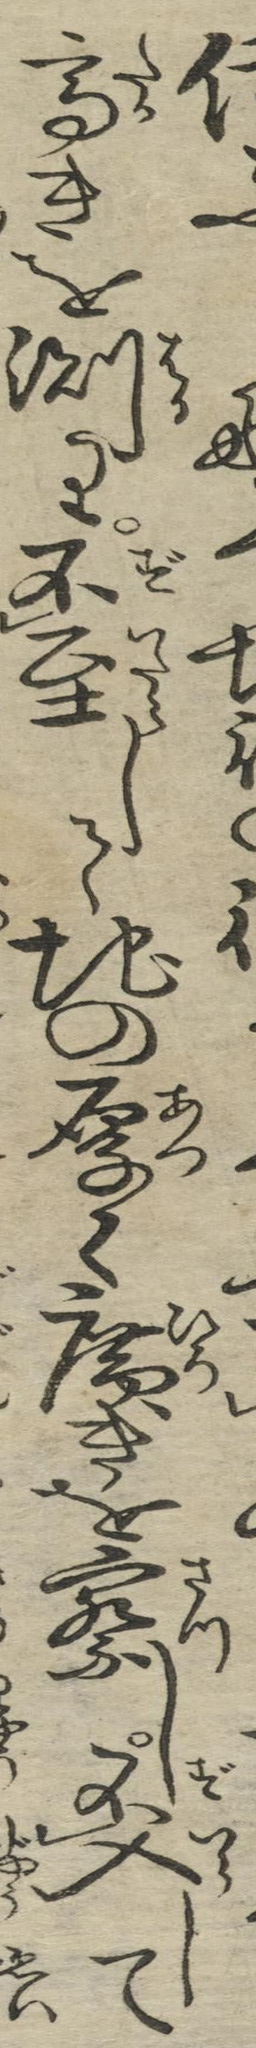高きを測り。不至して地の厚く廣きを察し。不入して
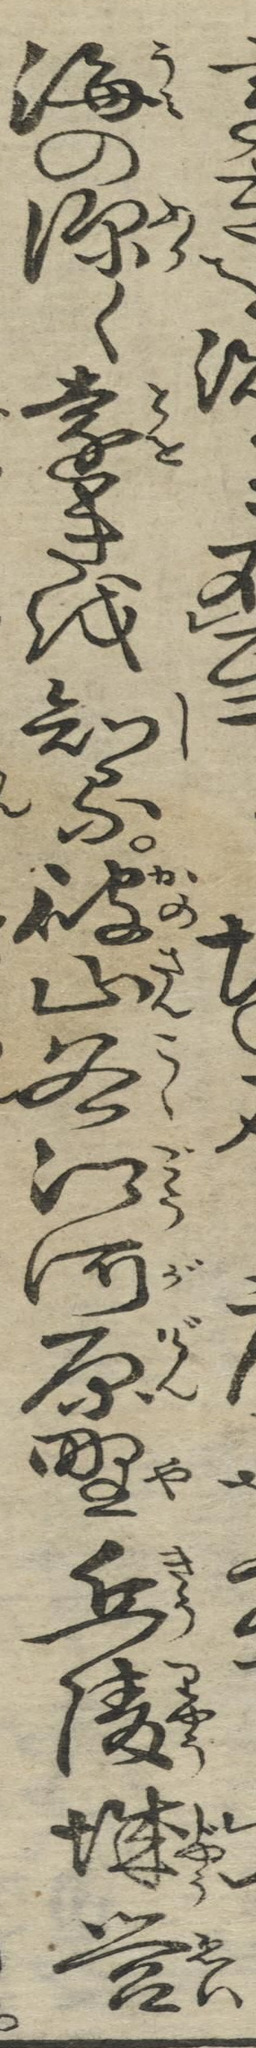海の深く遠きを知る。彼山谷江河原野丘陵城営
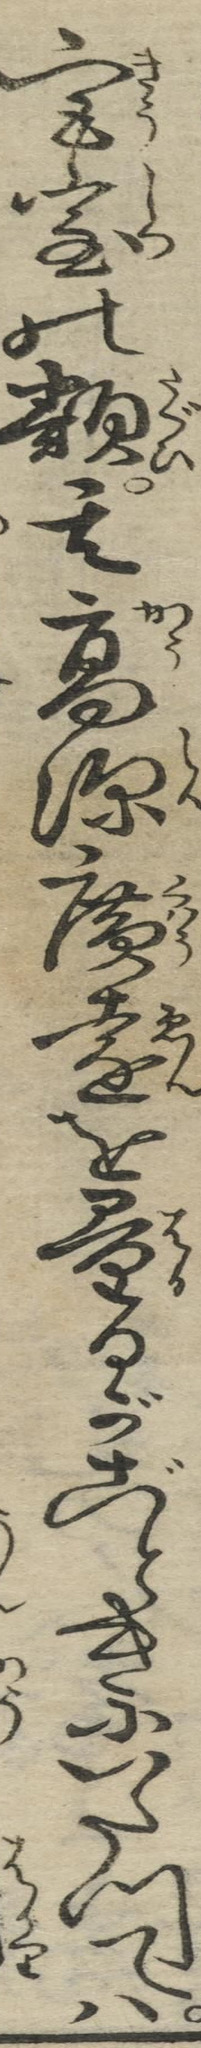宮室の類。其高深広遠を量るがごときにいたつては。
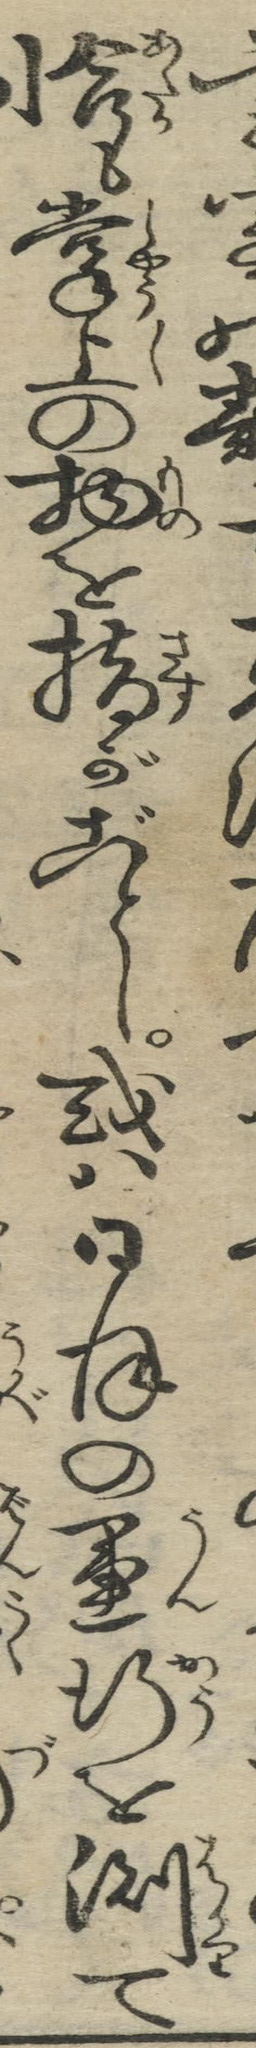恰も掌上の物を指がごとし。或は日月の運行を測て
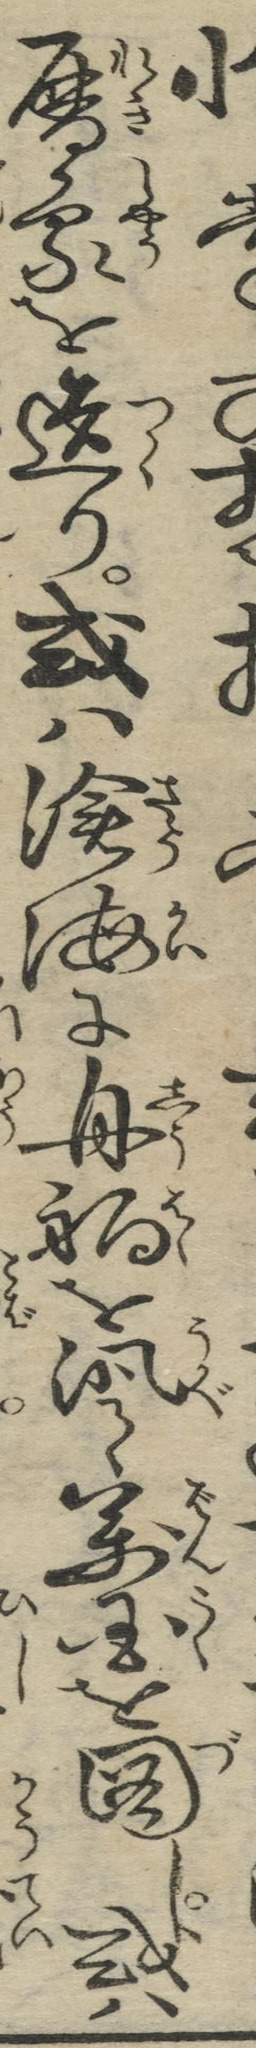暦象を造り。或は滄海に舟舶を汎て万国を図し。或は
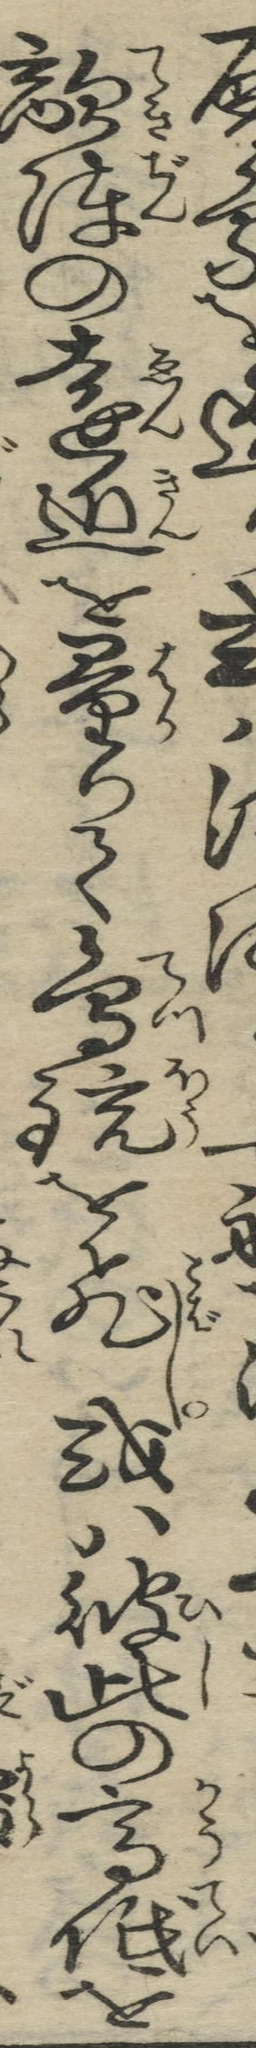敵陣の遠近を量りて鳥銃を飛し。或いは彼此の高低を
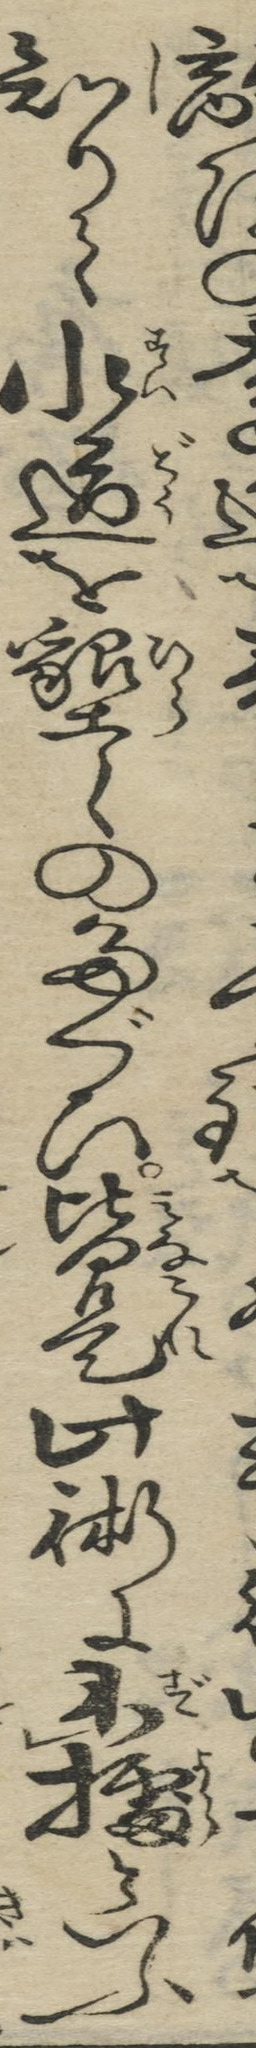知りて水道を墾くのたぐい。皆是此術に不據といふ
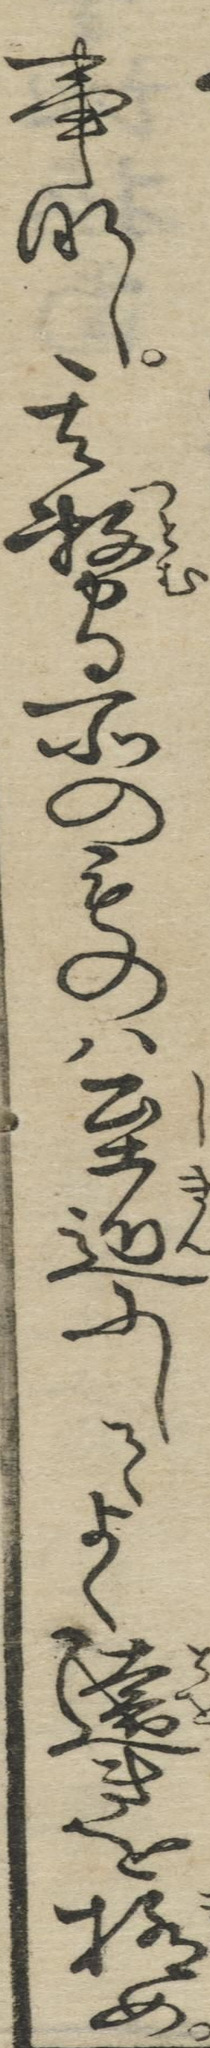事なし。其努る所のものは至近にしてよく遠きを極め。
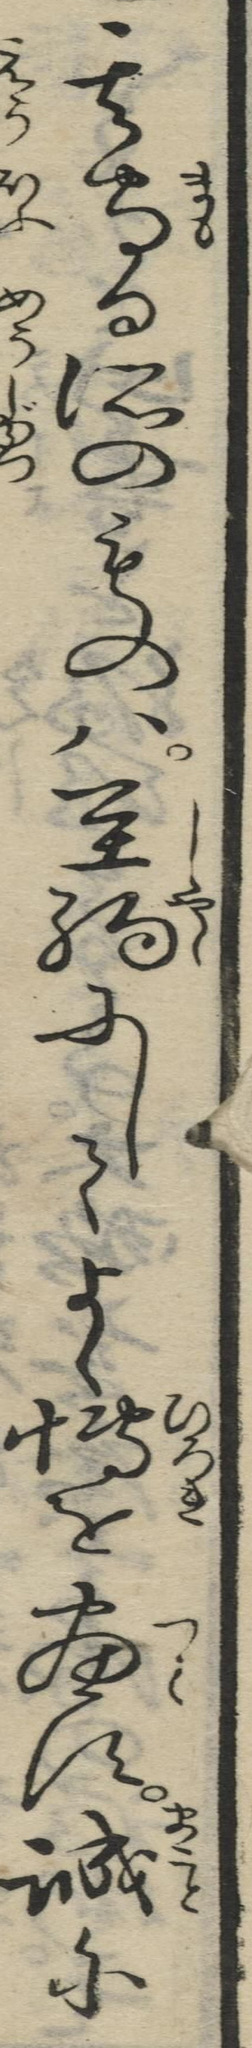其守る所のものは。至約にしてよく博を尽す。誠に
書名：量地指南　巻之一（内題）
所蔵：東京大学地震研究所図書室 Earthquake Research Institute Library, The University of Tokyo, JAPAN
